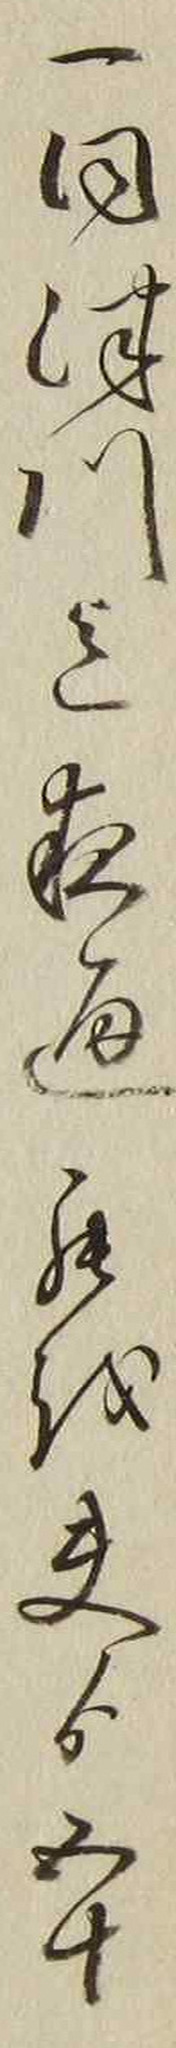一同津川迄夜通罷越夫ゟ五十
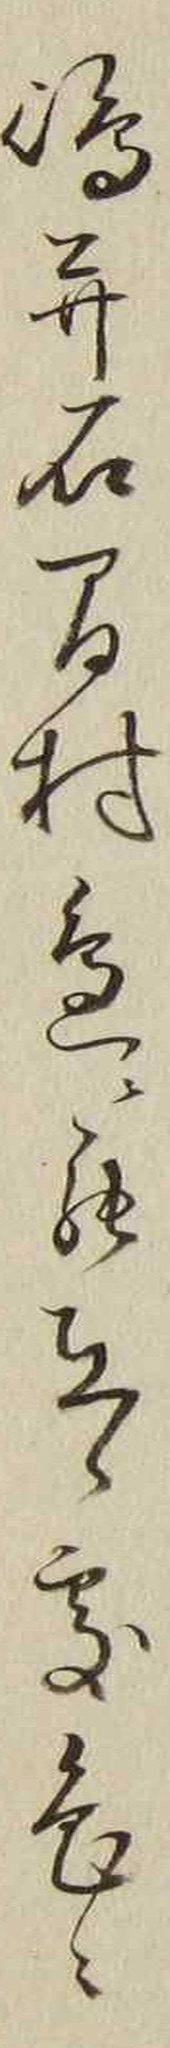嶋幷石間村辺ニ罷在候処色々

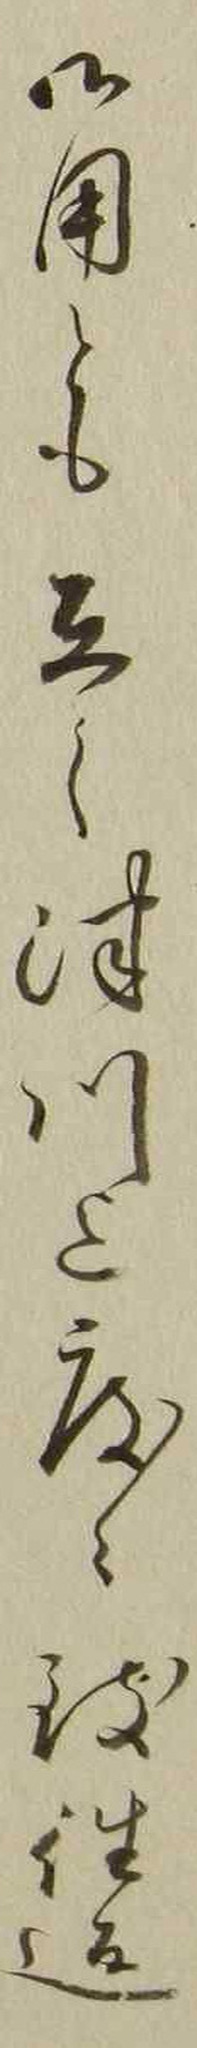御用とも在之津川迄度々致往返
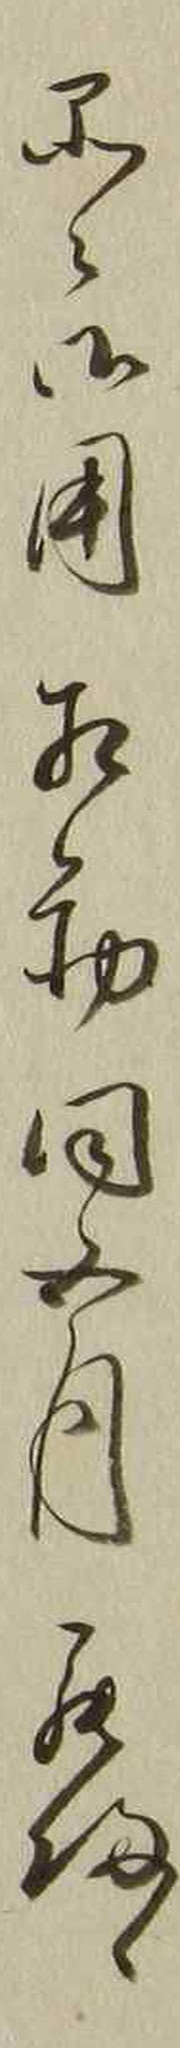品々御用相勤同五月罷帰候
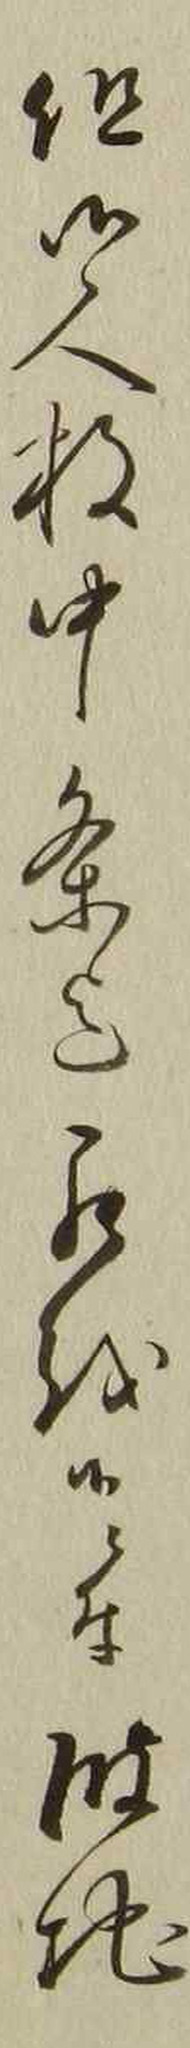但御人数中条迄罷越候ニ付彼地
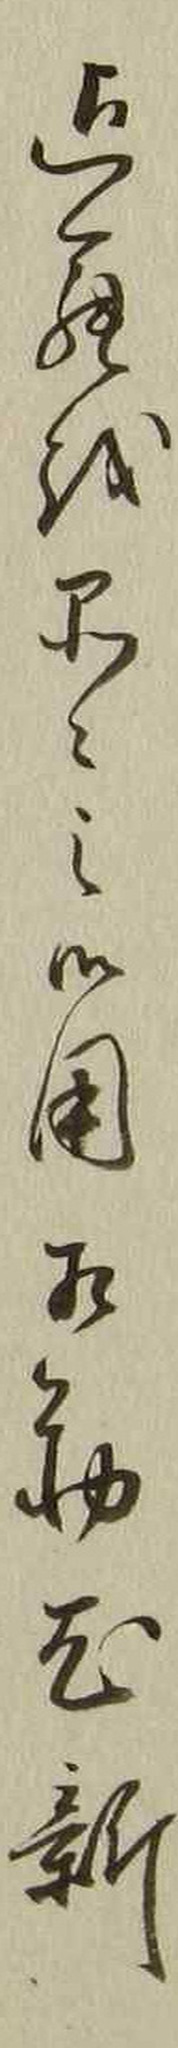迄罷越品々之御用相勤尤新
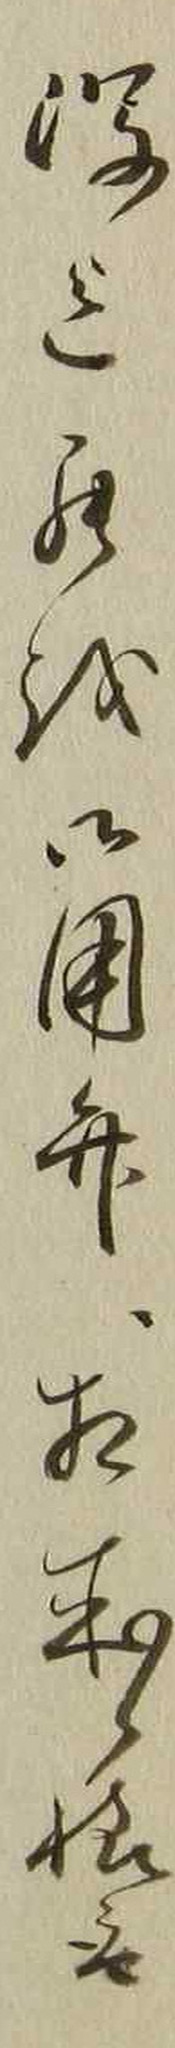潟迄罷越御用弁相成候様取
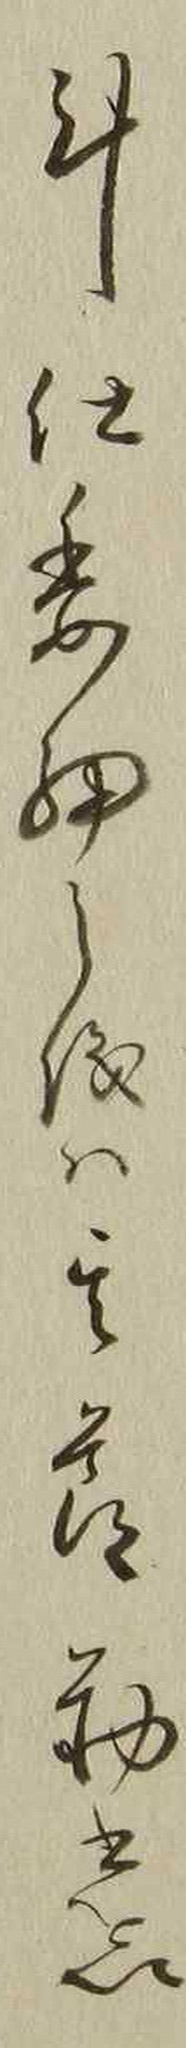計仕委細之儀ハ其節勤書を以
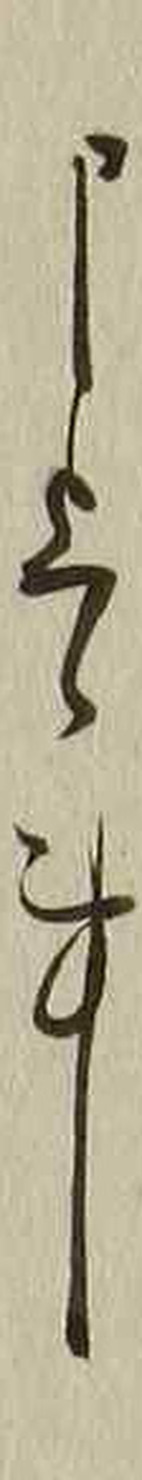申上候事
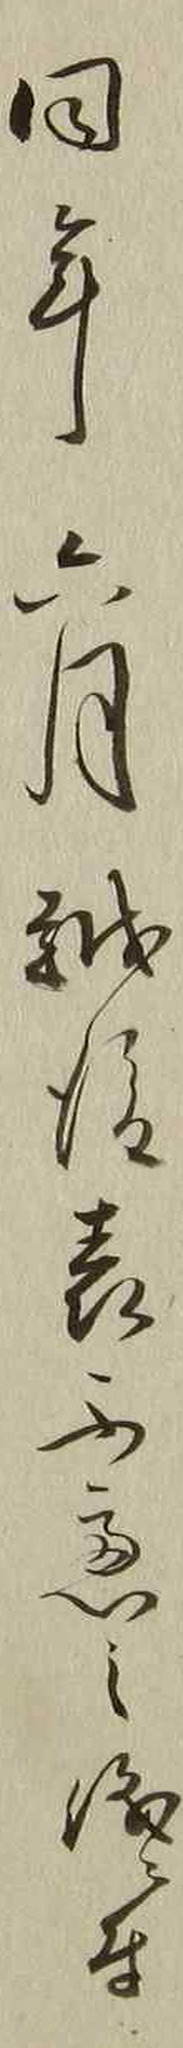同年六月越後表不慮之儀ニ付
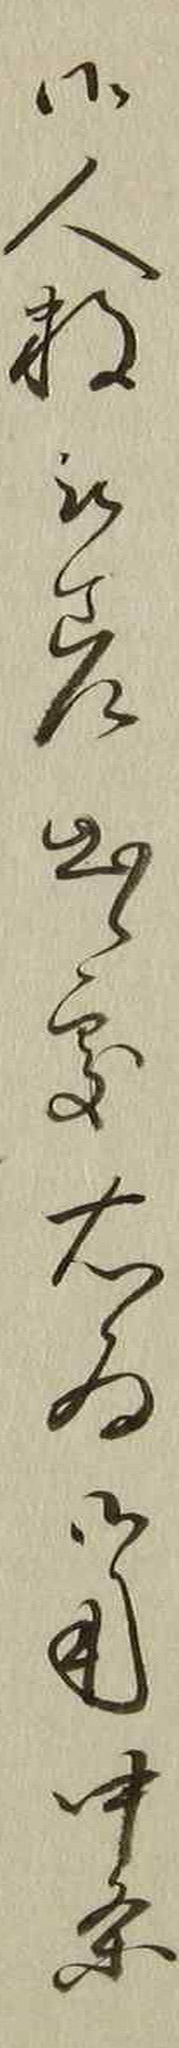御人数被差出候処右為御用中条
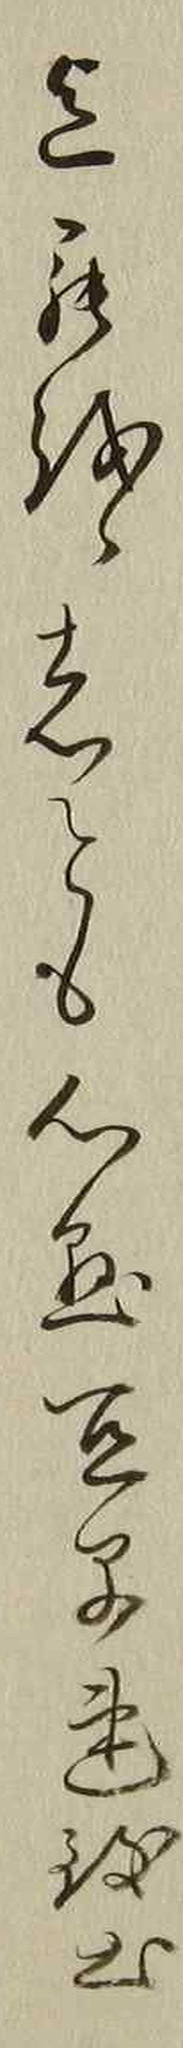迄罷越候者とも心懸宜早速致出
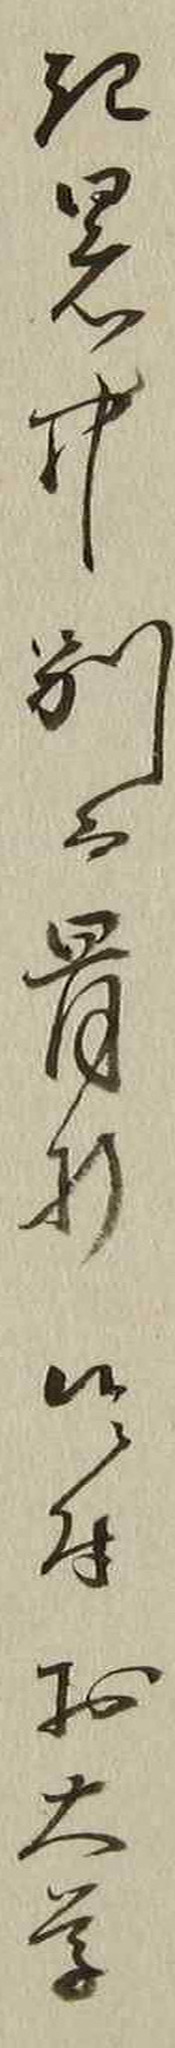起暑中別而骨折候ニ付於大学
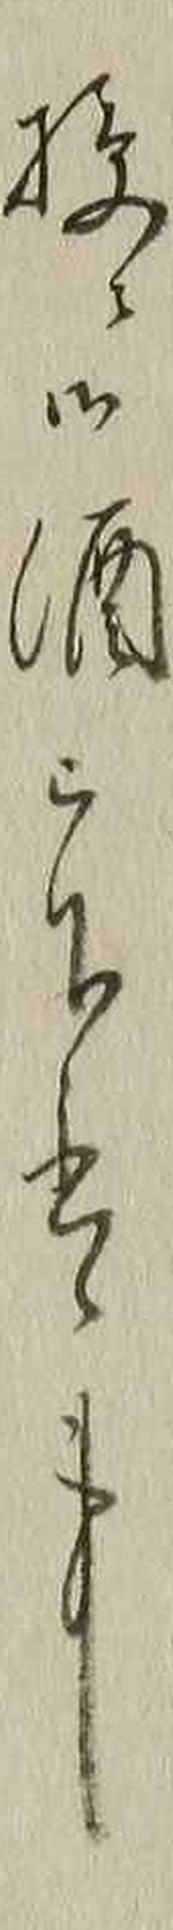校ニ御酒被下置候事
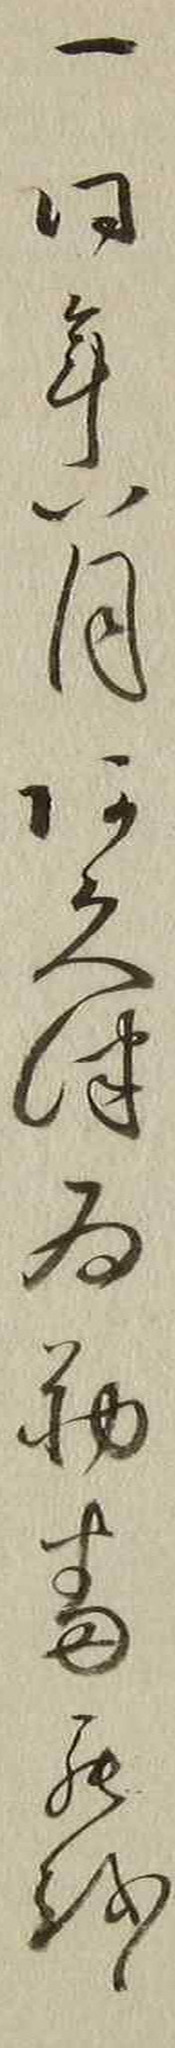一同年八月阿久津為勤番罷越候
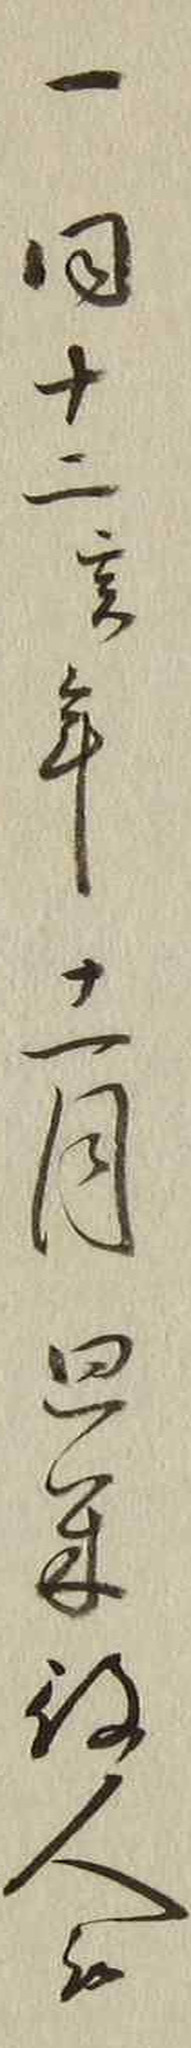一同十二亥年十一月廻米役人被
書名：諸士系譜　巻之52　に之部3
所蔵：会津若松市立会津図書館
